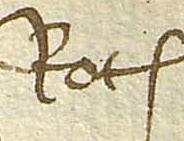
Rot*
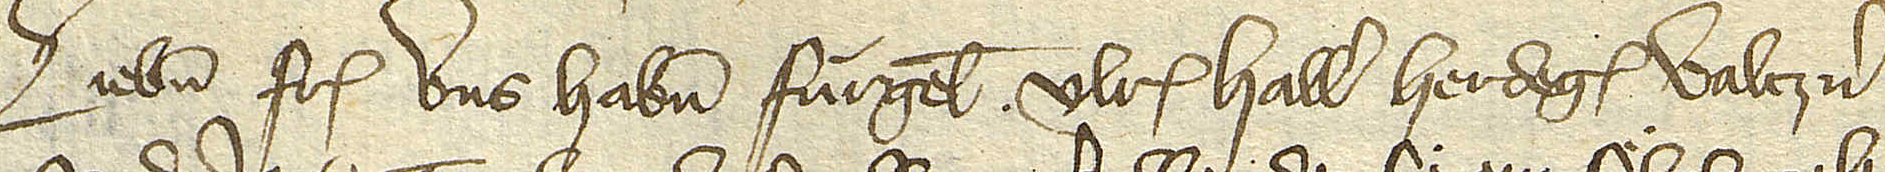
Liebn* fr* vns habn* fürgel* . vlr* hall* herdeg* valcʒn*
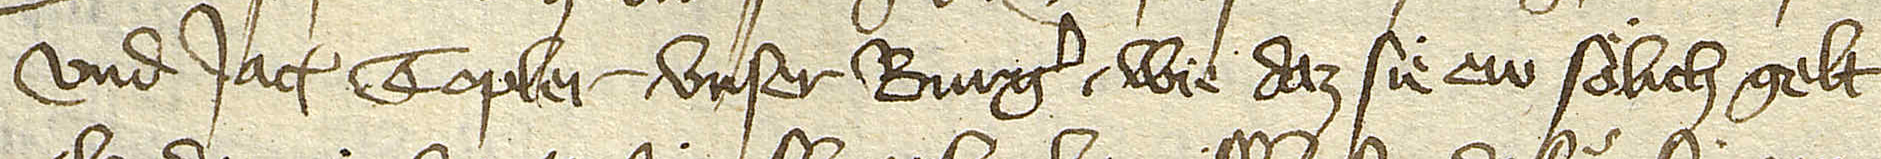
vnd Iac* Topler / vnſer Burg* / wie daʒ ſie ew ſölich gelt
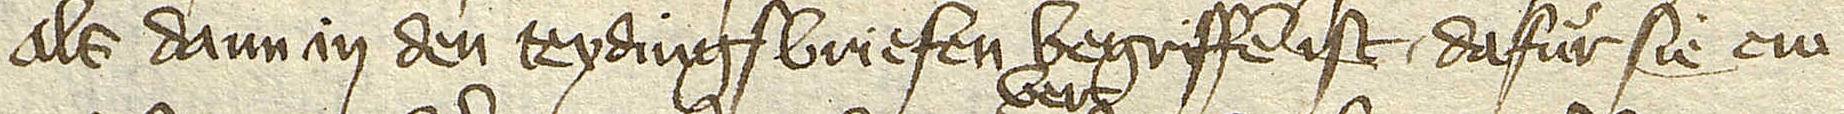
als dann in den teydingſbriefen begriffe* iſt / dafür ſie ew
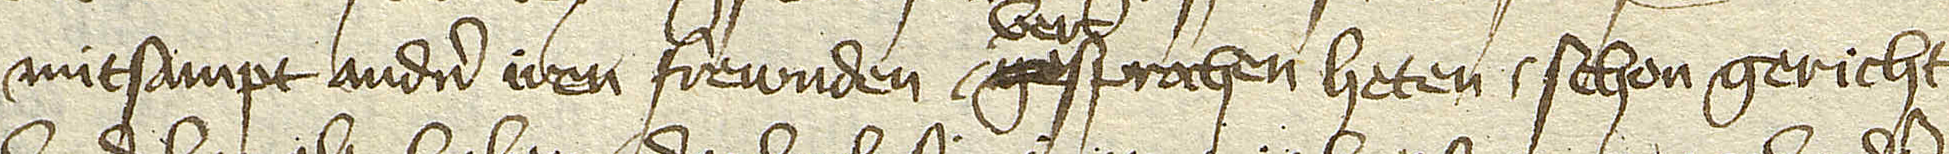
mitſampt andn* iren frewnden / geſprochen heten / ſchon gericht
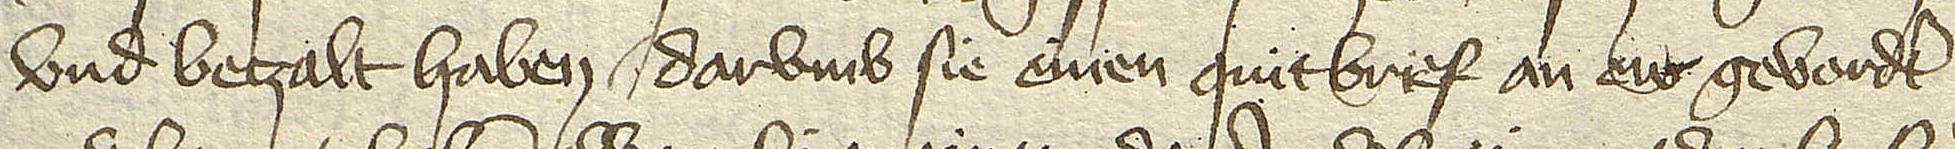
vnd becʒalt haben / darvmb ſie einen quitbrief an ew gevordt*
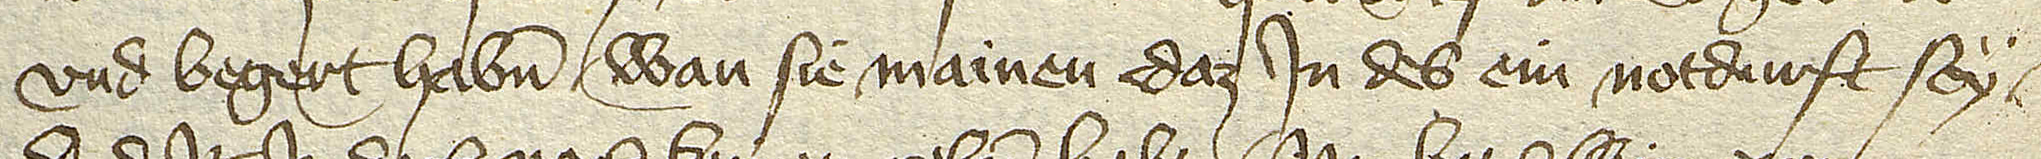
vnd begert habn* / wan ſie mainen / daʒ In des ein notdurft ſey /
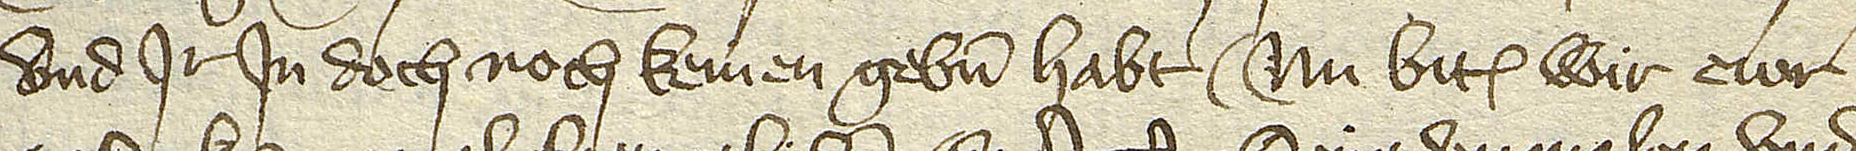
Vnd Ir In doch noch keinen gebn* habt / Nu bit* wir ewr
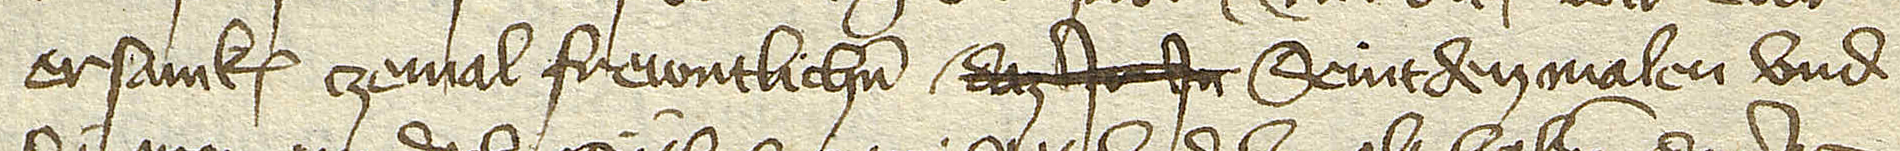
erſamk* cʒemal frewntlichn* / daʒ Ir In Seintdenmalen vnd
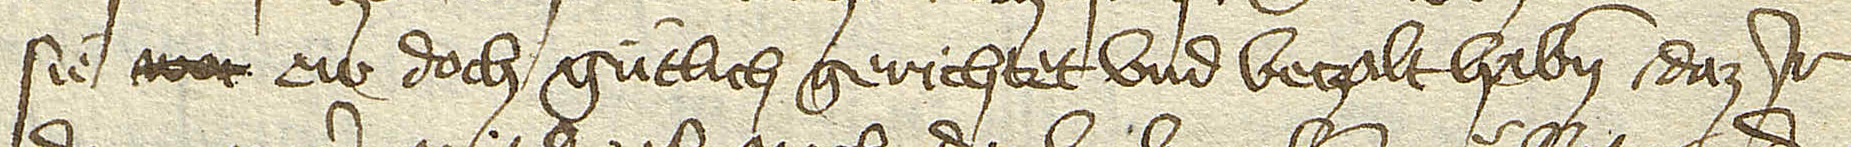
ſie wer ew doch gütlich gerichtet vnd becʒalt habn* / daʒ Ir
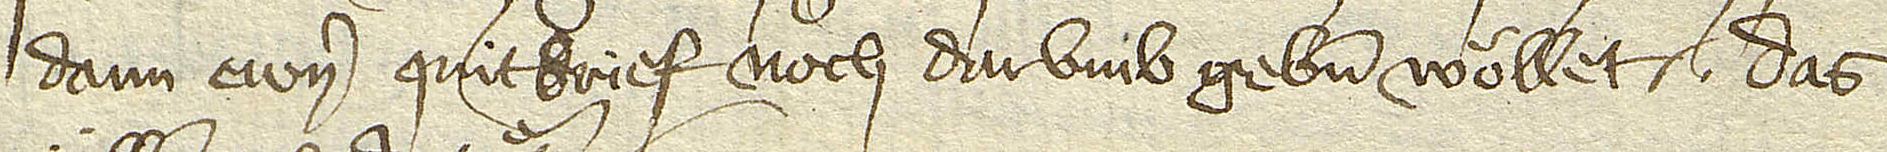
dann ewn* quitbrief noch darvmb gebn* wöllet / . das
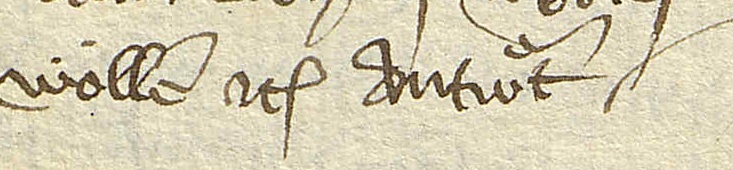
wölle* ec* Antw*t /
